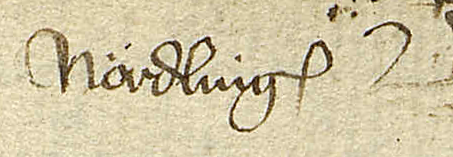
Nördling*
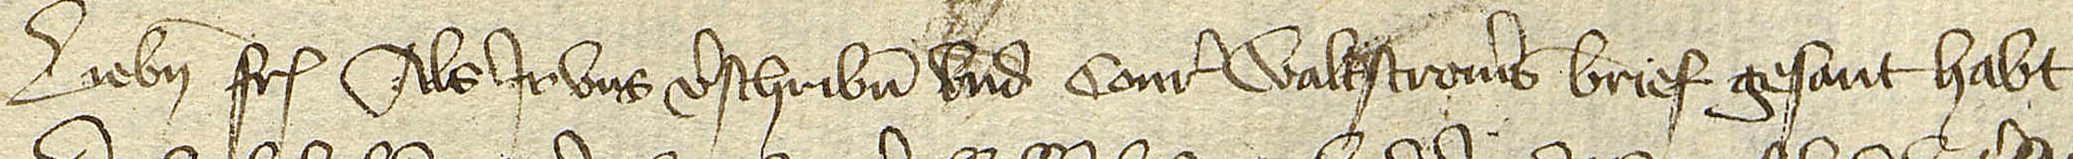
Liebn* fr* Als Ir vns v*ſchribn* vnd Conr* Waltſtrom*s brief geſant habt
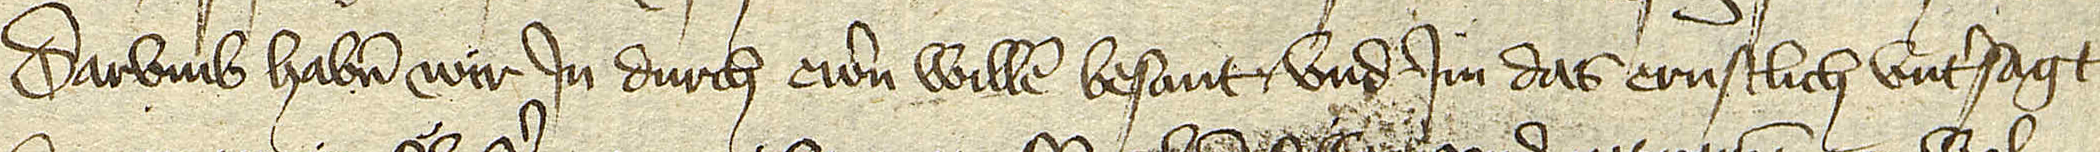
Darvmb habn* wir In durch ew*n wille* beſant / vnd Im das ernſtlich vnt*ſagt
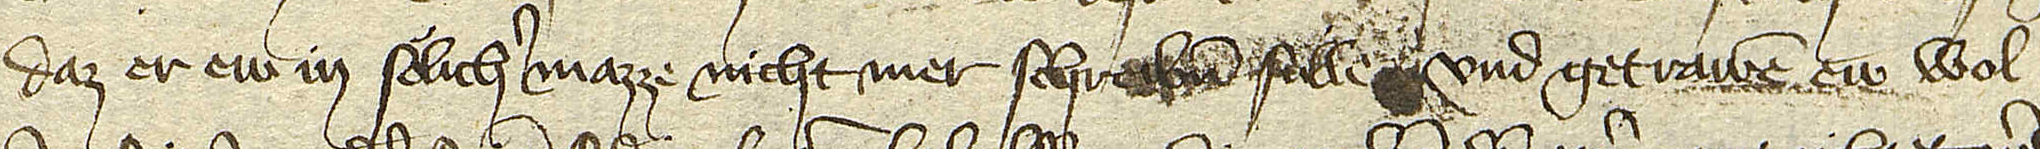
daʒ er ew in ſölich* maʒʒe nicht mer ſchreibn* ſulle vnd getrawe* ew wol
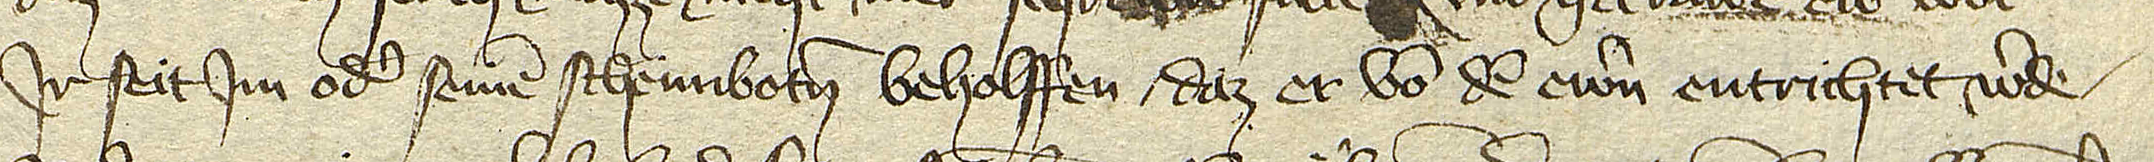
Ir ſeit Im od* ſeine* ſcheinbotn* beholffen / daʒ er vo* d* ewn* entrichtet w*de /
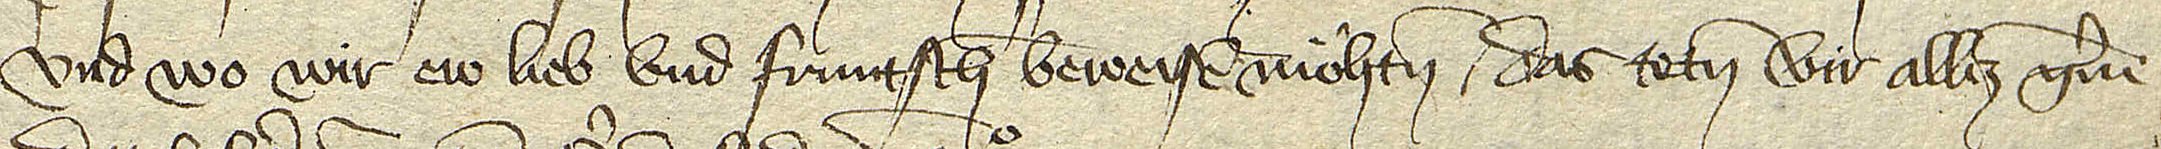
vnd wo wir ew lieb vnd fruntſch* beweiſe* möhtn* / Das tetn* wir allcʒ* g*ne
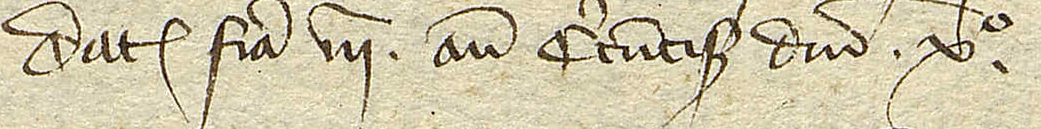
Dat* fia* iii* . an* C*cu*ciſ* dm* . x* .
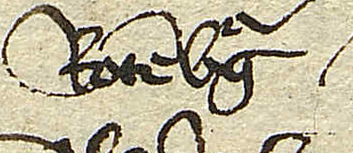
Rote*b*g /
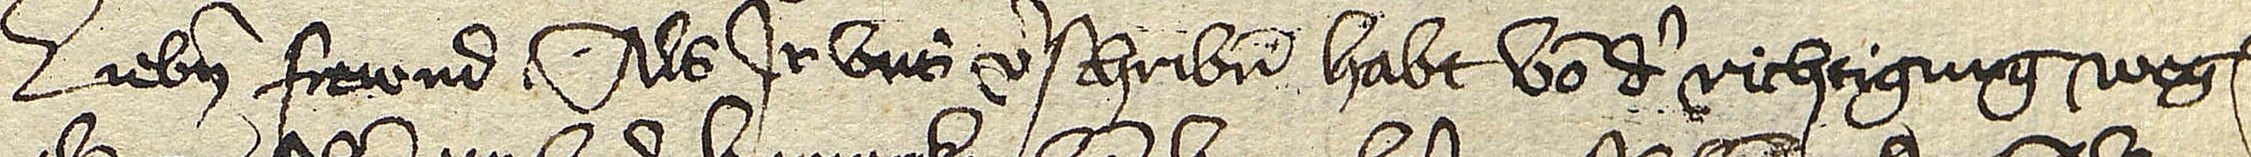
Liebn* frewnd / Als Ir vns v*ſchribn* habt vo* d* richtigung weg*
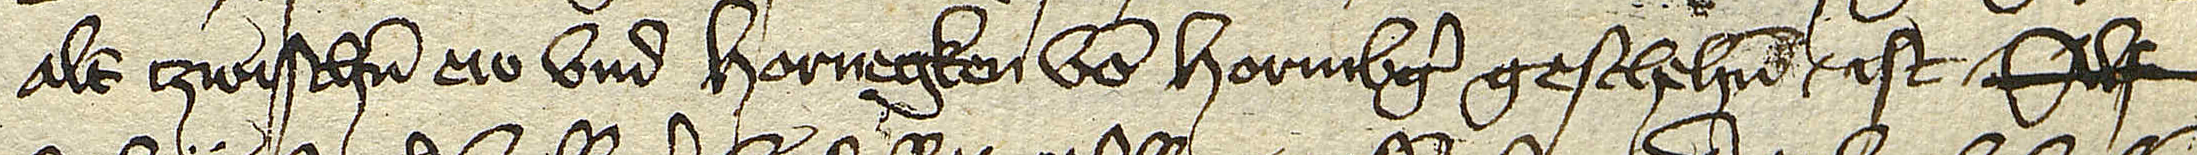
als cʒwiſchn* ew vnd hornegken vo* hormbg* geſchehn* / iſt / Alſ
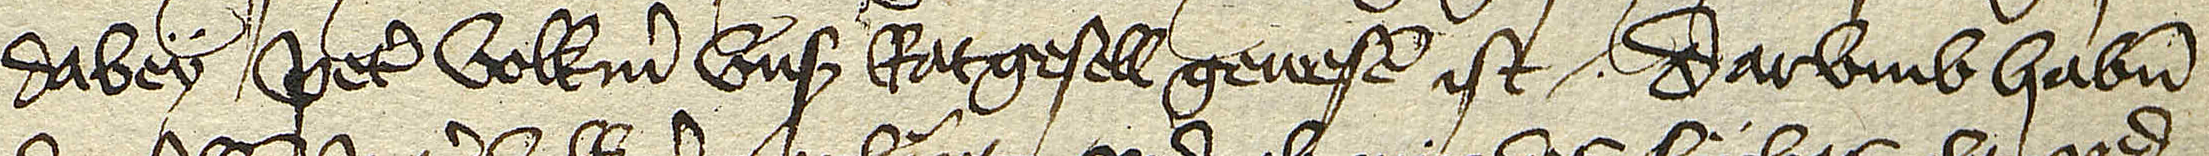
dabey / Pet* Volkm* vnſ* Ratgeſell geweſe* iſt /. Darvmb habn*
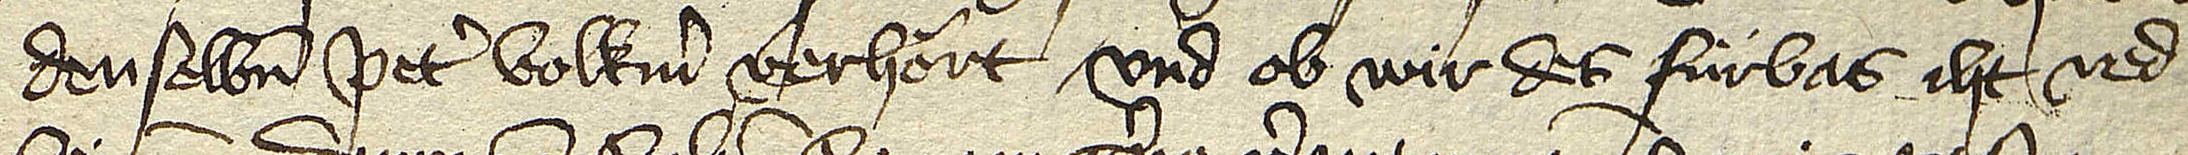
denſelbn* Pet* volkm* verhört / vnd ob wir des fürbas iht red
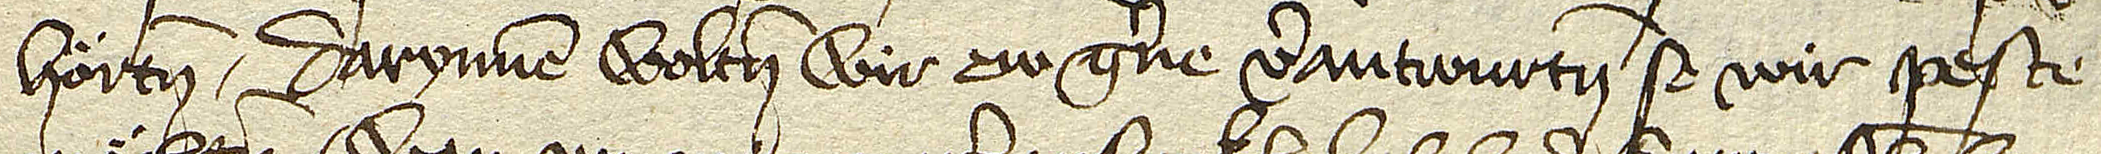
hörtn* / darynne woltn* wir ew g*ne v*antwurtn* ſo wir peſte
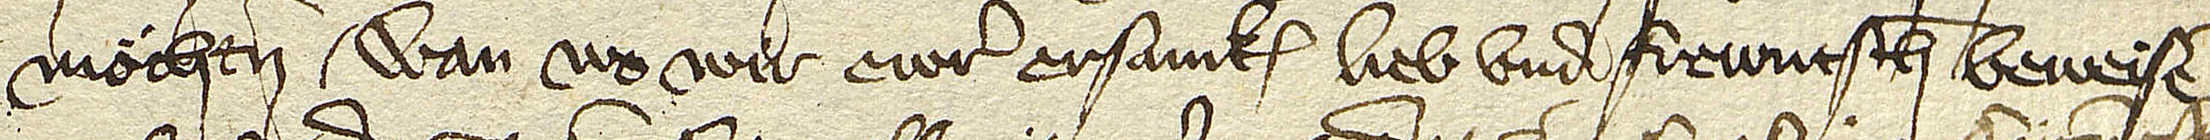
möchtn* / wan wo wir ewr* erſamk* lieb vnd frewntſch* beweiſe*
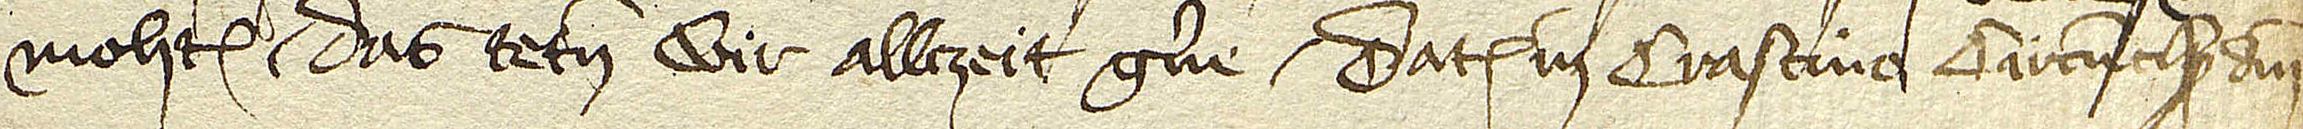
moht* / das tetn* wir allcʒeit g*ne / Dat* in Craſtino Circu*ciſ* dm*
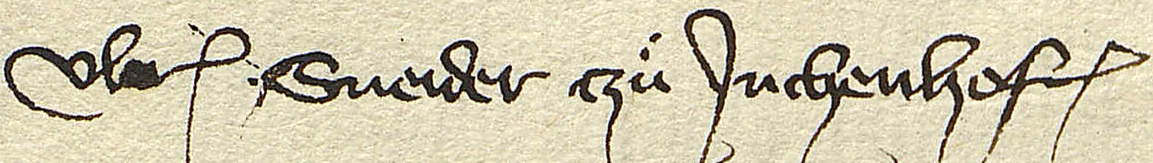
vlr* Sneider cʒü Inchenhof*
